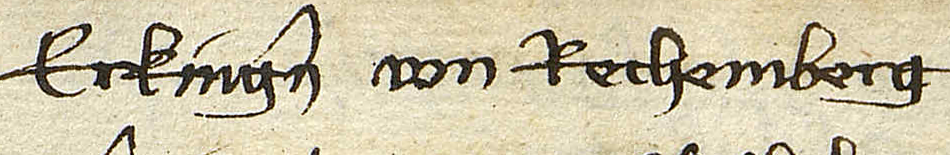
Erking*n von Rechemberg
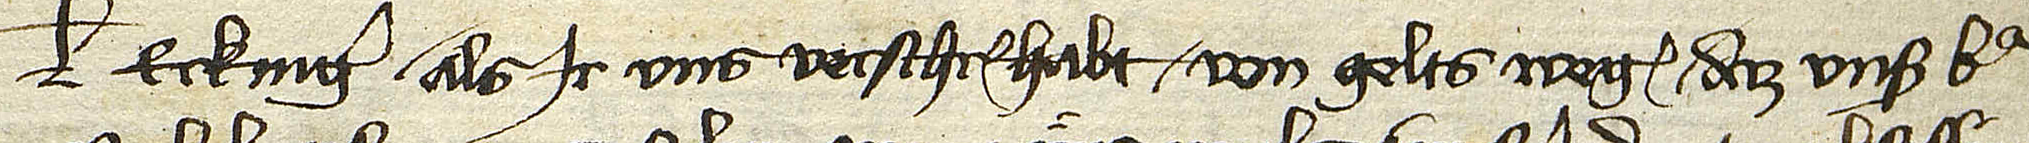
L* Erking* / als Ir vns verſchr* habt / von gelts weg* / daʒ vnſ* b*
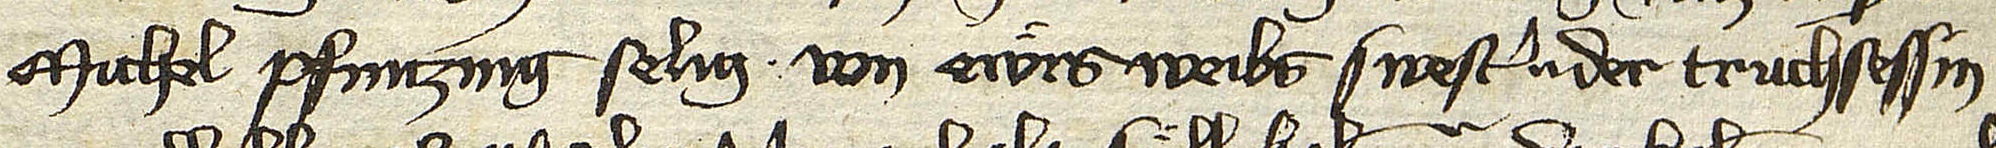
Michel pfincʒing ſelig . von ewrs weibs ſweſt* ~ der truchſeſſin
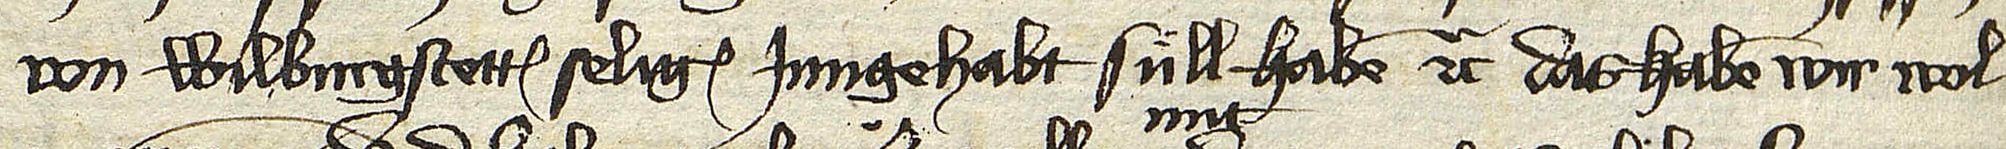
von Wilburgſtett* ſelig* Inngehabt ſüll habe* ec* das habe* wir wol
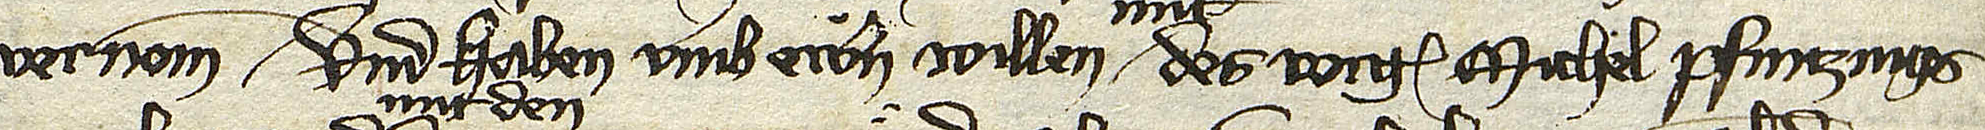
vernom* / Vnd haben vmb ew*n willen / des vorg* Michel Pfincʒings
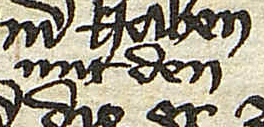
mit den
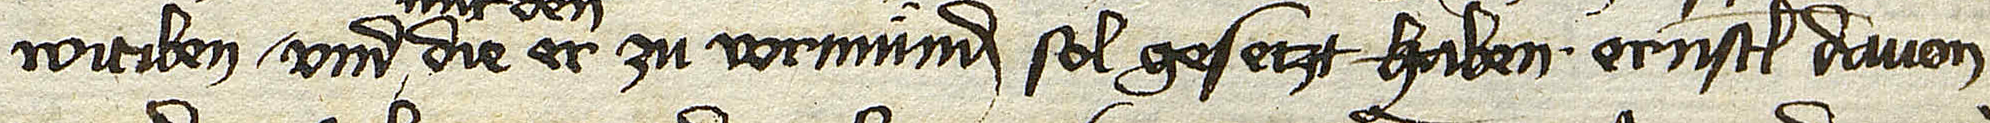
witiben / vnd die er ʒu vormünd* ſol geſecʒt haben . ernſtl* dauon
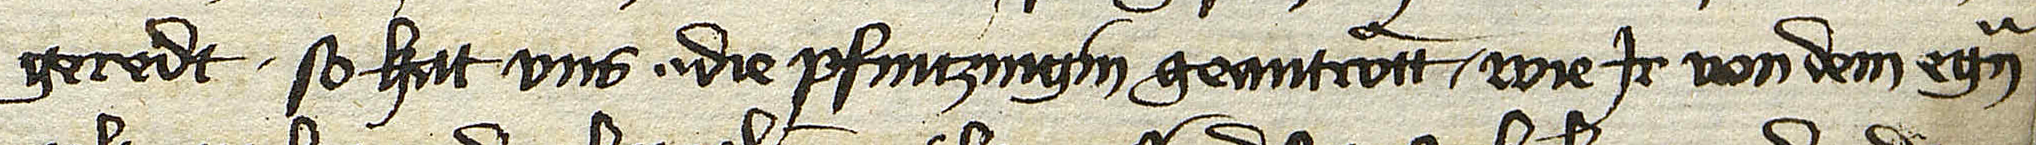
geredt / ſo hat vns ~ die pfincʒingin geantw*tt / wie Ir von dem eg*n
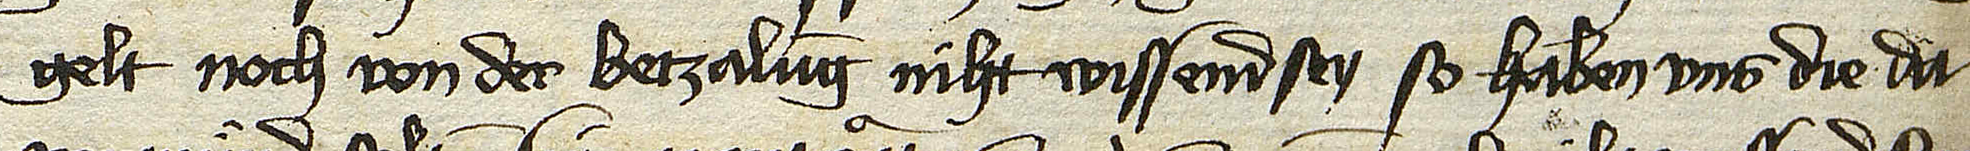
gelt noch von der becʒalu*g niht wiſſend ſey ſo haben vns die da
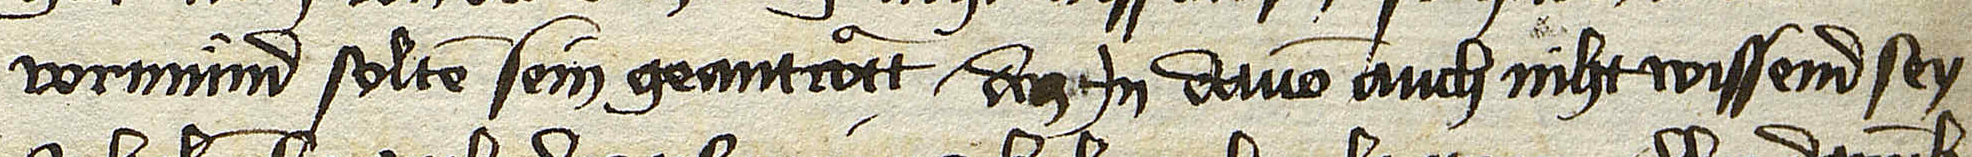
vormünd* ſolte* ſein geantw*tt / daʒ In dauo* auch niht wiſſend ſey
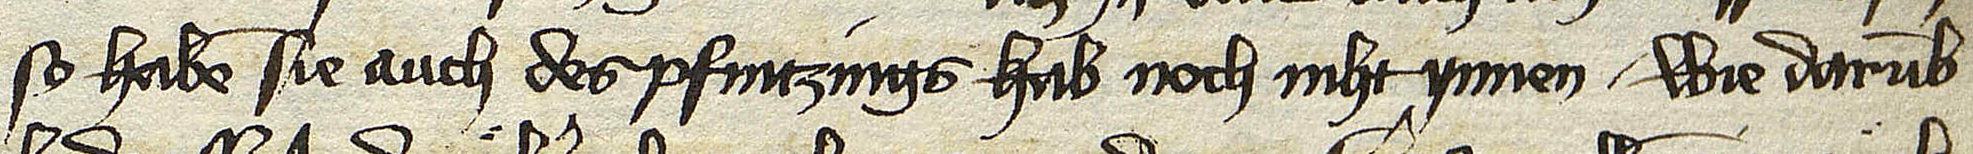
ſo habe* ſie auch des pfincʒings hab noch niht ynnen / Wie daru*b
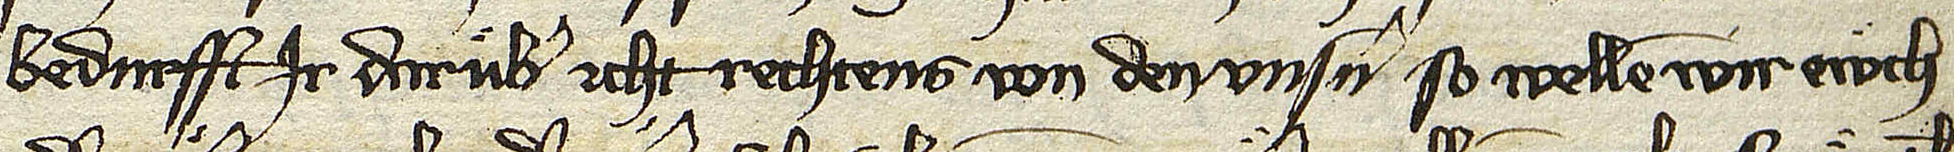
bedurfft Ir darüb* icht rechtens von den vnſ*n ſo welle* wir ewch
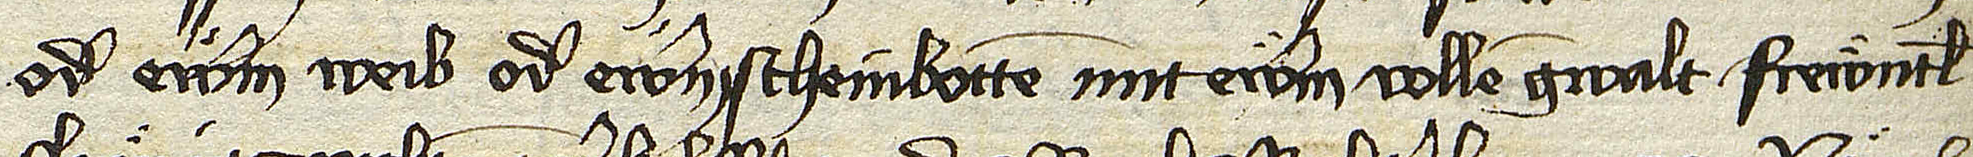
od* ew*m weib od* ew*n ſcheinbotte* mit ew*m volle* gwalt / frewntl*
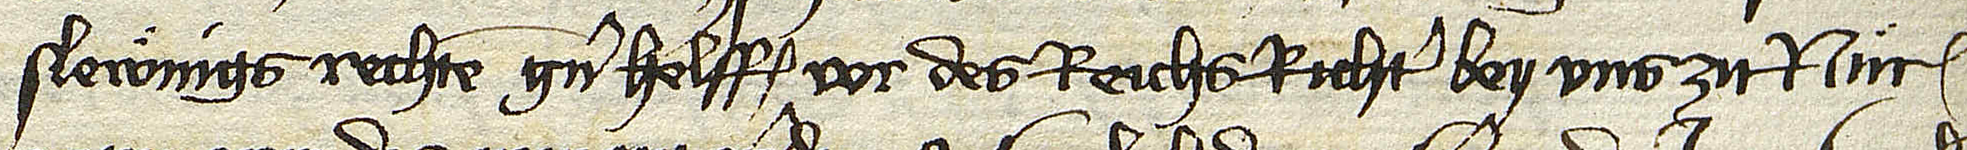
ſlewnigs rechte* g*n helff* vor des Reichs Richt* bey vns ʒu Nür*
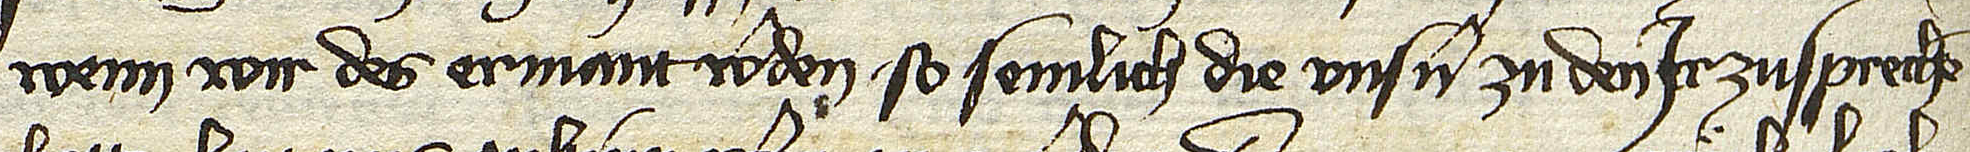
wenn wir des ermant w*den / ſo ſemlich die vnſ*n ʒu den Ir ʒuſpreche*
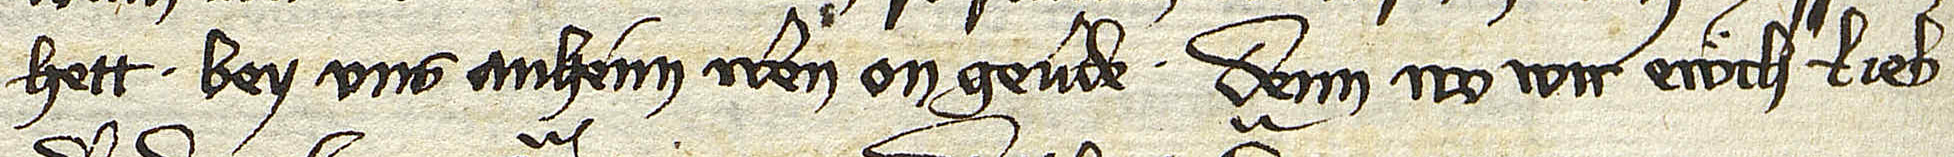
hett . bey vns anheim w*en on geu*de . Denn wo wir ewch lieb
